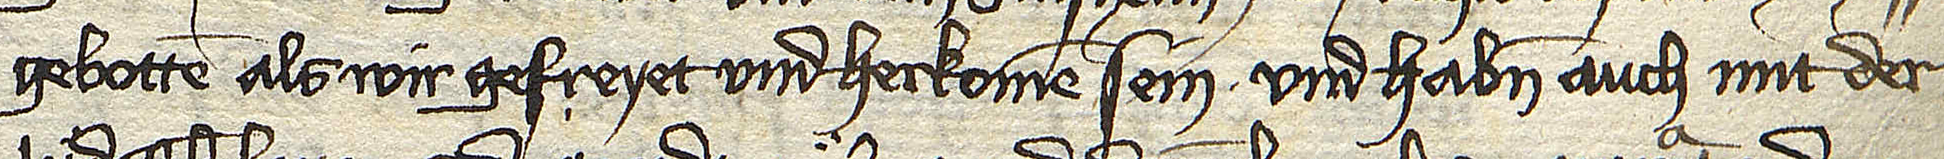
gebotte* als wir gefreyet vnd herkome* ſein . vnd habn* auch mit der
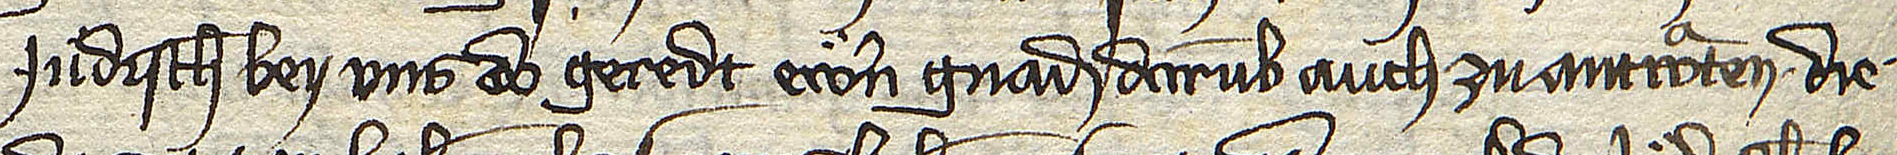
Iüdiſch* bey vns do geredt eẅ*n gnad* darub* auch ʒu antw*ten . die
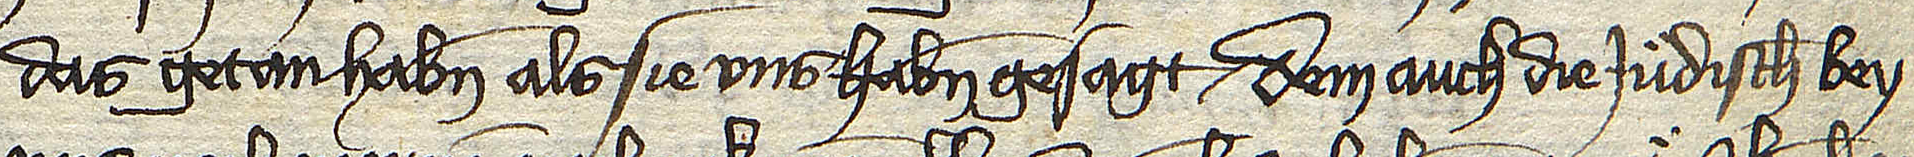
das getan habn* als ſie vns habn* geſagt / Denn auch die Iüdiſch* bey
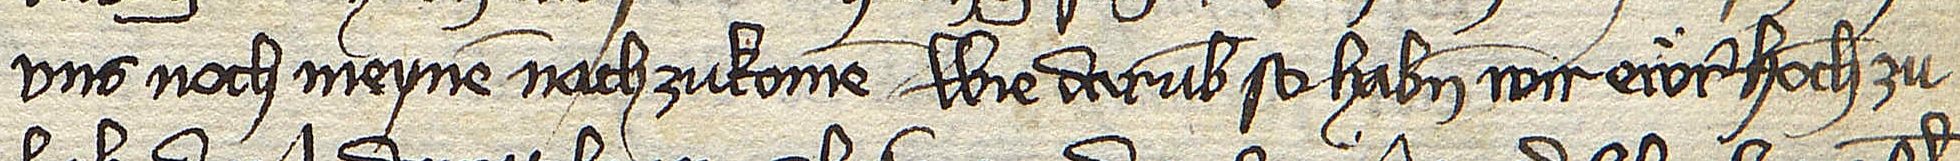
vns noch meyne* nach ʒukome* / Wie darub* ſo habn* wir eẅr* hoch* ʒu
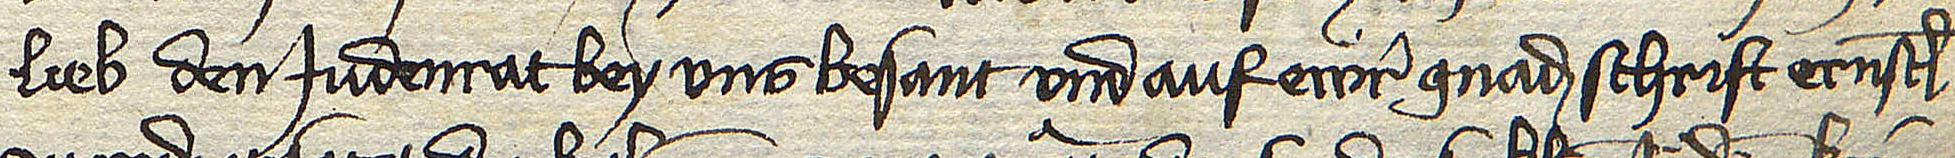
lieb den Iudenrat bey vns beſant vnd auf eẅr* gnad* ſchrift ernſtl*
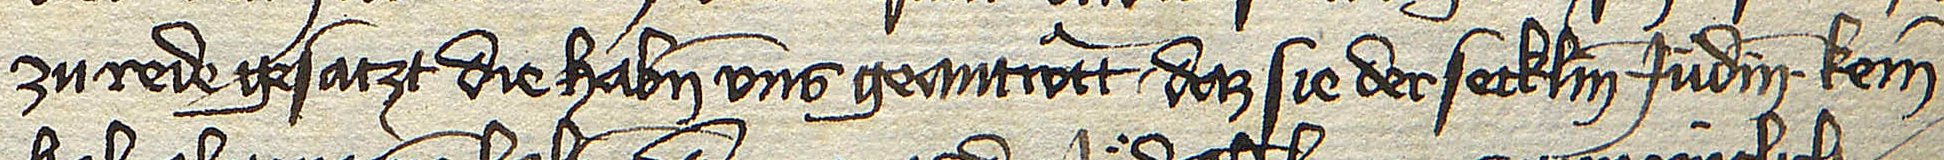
ʒu rede geſacʒt die habn* vns geantw*tt / daʒ ſie der ſecklin* Iüdin* kein
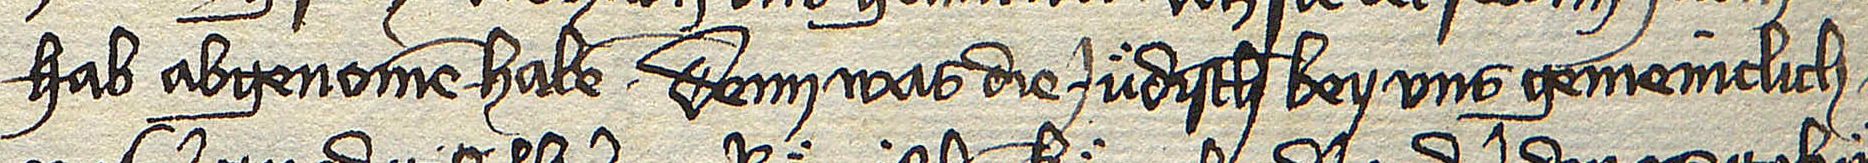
hab abgenome* habe* . Denn was die Iüdiſch* bey vns gemeinclich
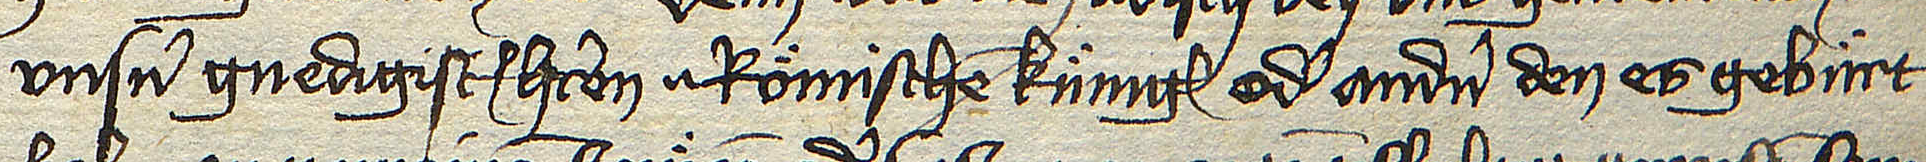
vnſn* gnedigiſt* h*ren ~ Römiſche* künig* od* andn* den es gebürt
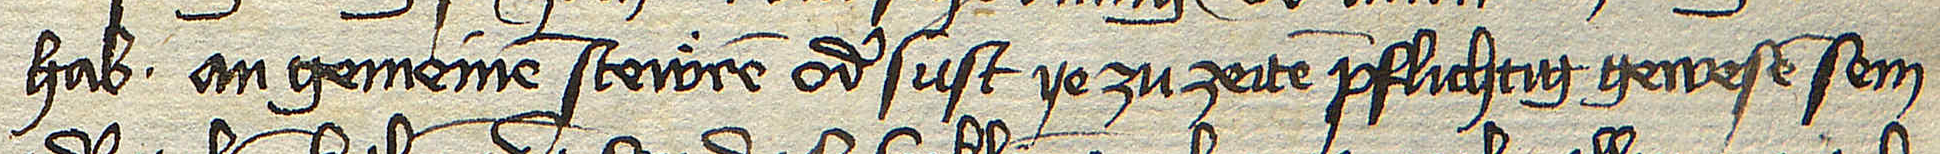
hab . an gemeine* ſteẅre* od* ſuſt ye ʒu ʒeite* pflichtig geweſe* ſein
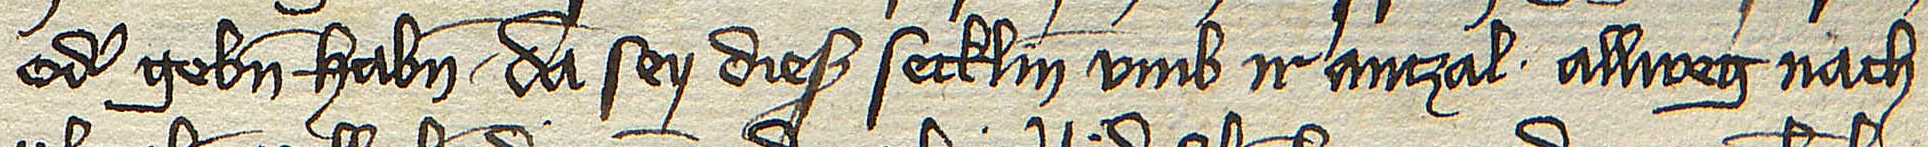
od* gebn* habn* / Da ſey dieſ* ſecklin* vmb ir ancʒal / allweg nach
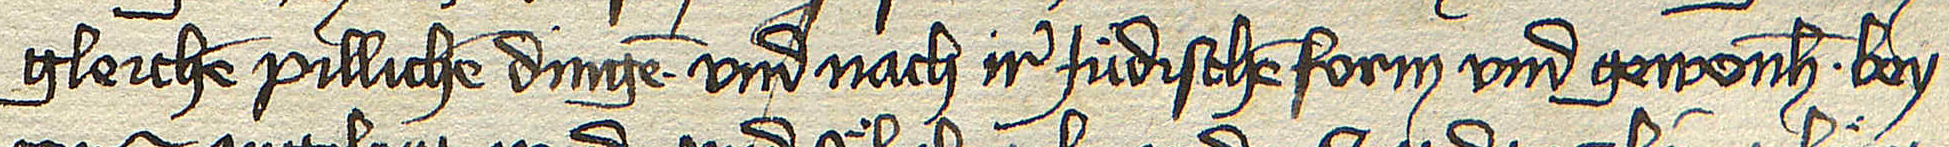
gleiche* pilliche* dinge* . vnd nach ir* Iüdiſche* form vnd gewonh* . bey
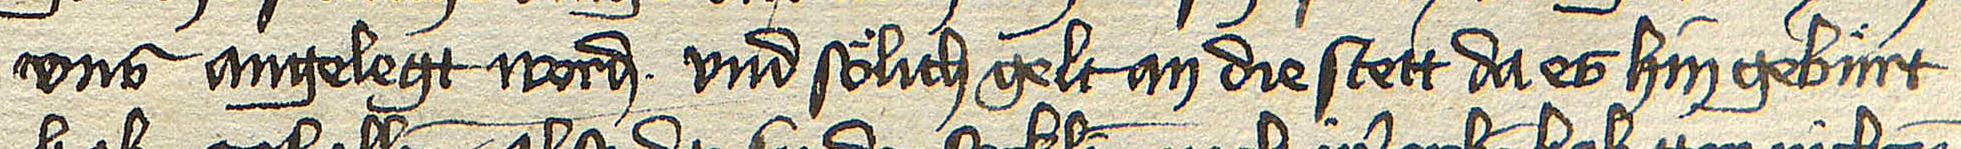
vns angelegt word* . vnd ſölich gelt an die ſtett da es hin gebürt
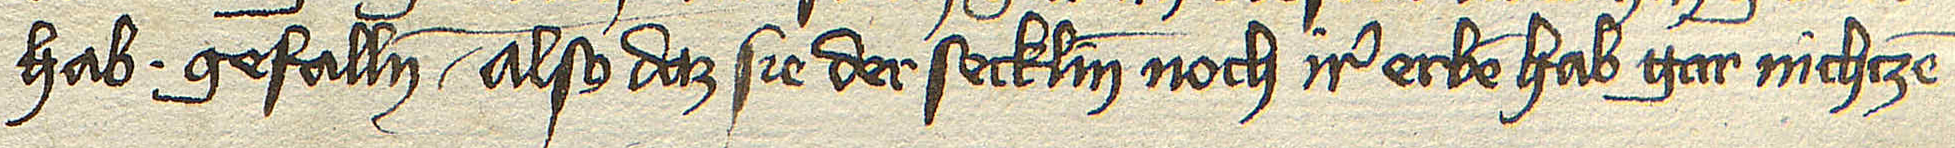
hab . gefalln* / alſo daʒ ſie der ſecklin* noch ir* erbe* hab gar nichcʒe*
